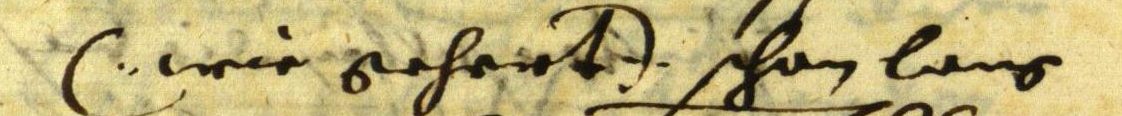(:wie gehert.). schon lang
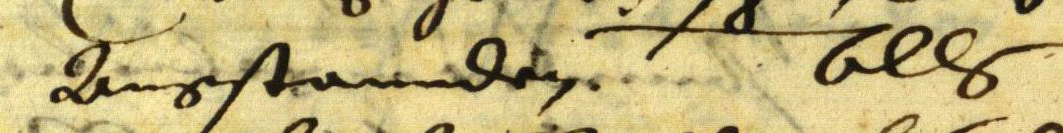Angestannden. Alls
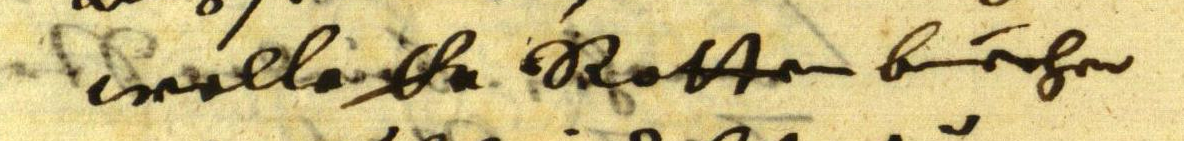welle Er Rotten būecher
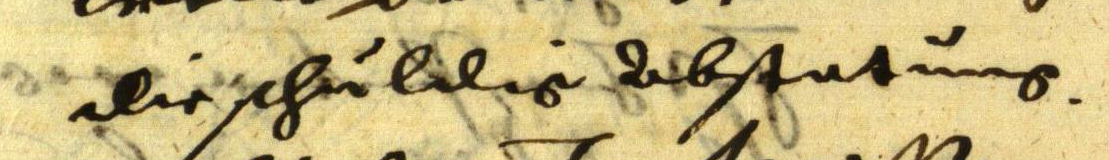die schūldig Abstatūng.
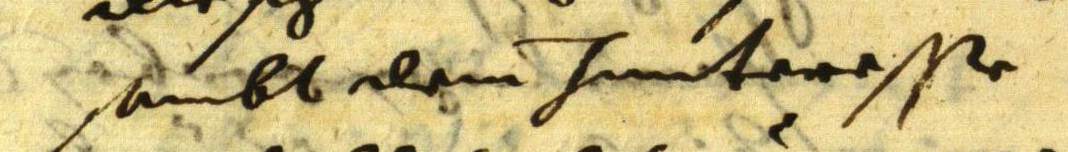sambt dem Innteresse
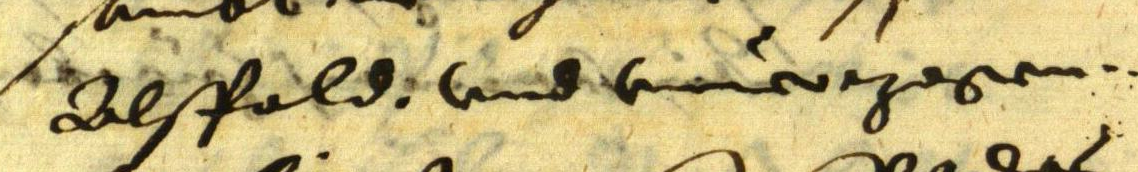Alspald. vnd vnv̄erzogen¬
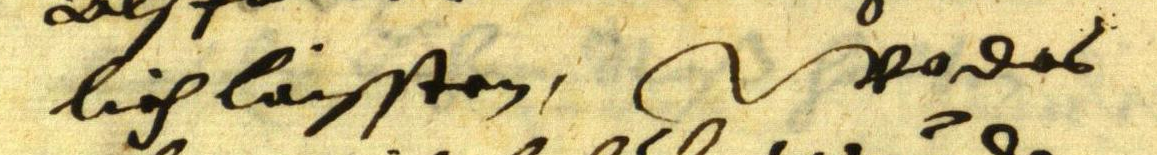lich laissten, Wo das
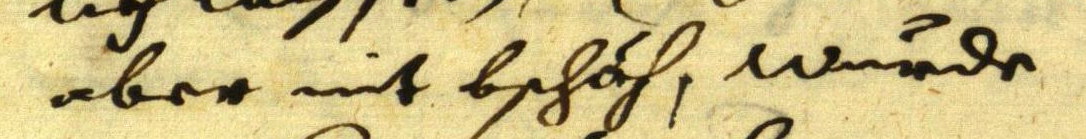aber nit bschōh, wūrde
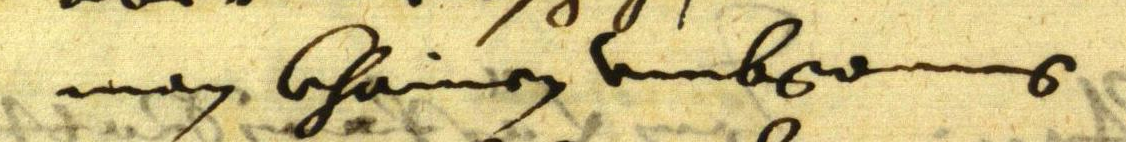man khainen vmbganng
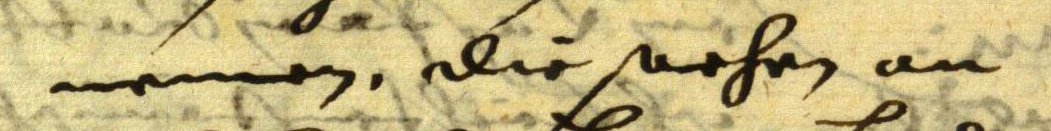nehmen, die sachen an
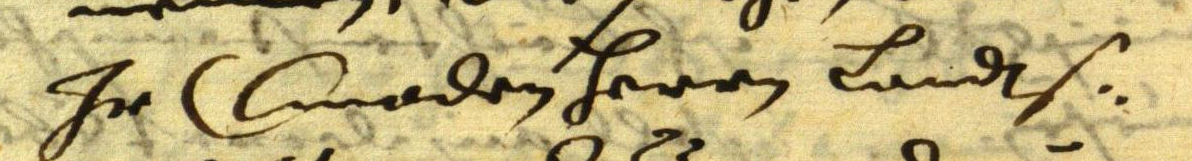Ir Gnaden herrn Landts¬
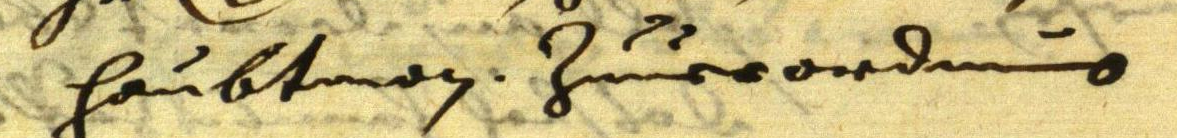haūbtman. Zūūer ordnūng
